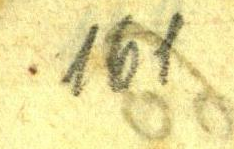161
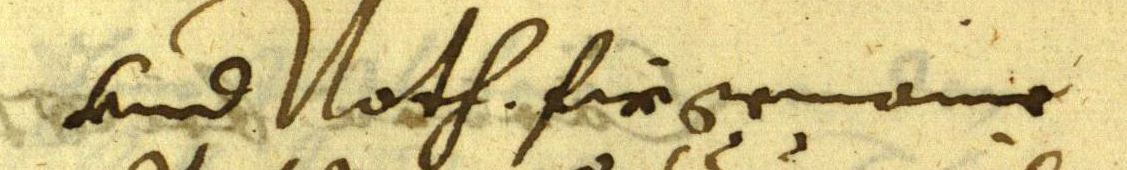vnd Noth. fir gemaine
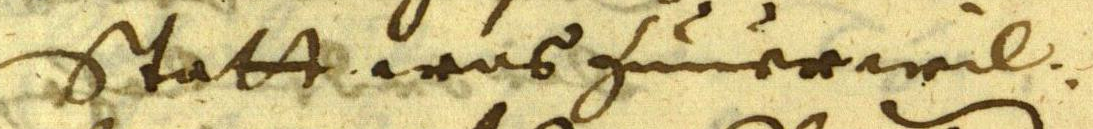Statt was Zūūerwil¬
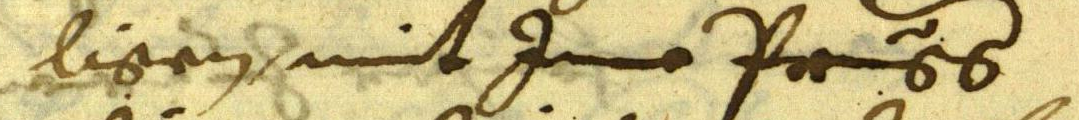ligen mit Ime Prūgg
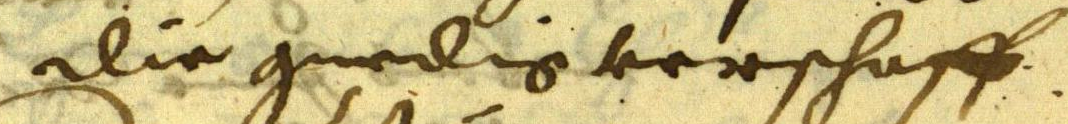die gnedig verschaff¬
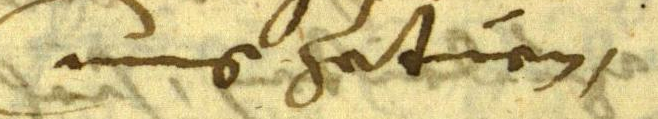ūng Zetūen,
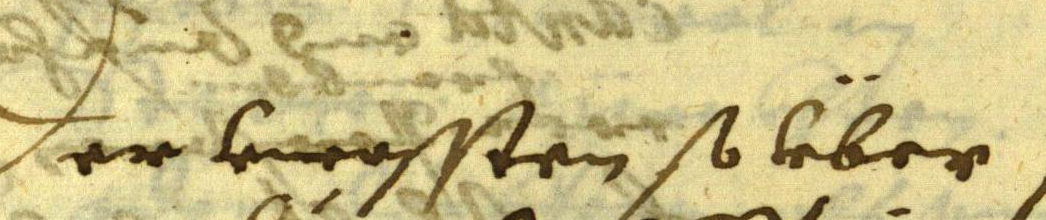Der vncossten so v̈ber
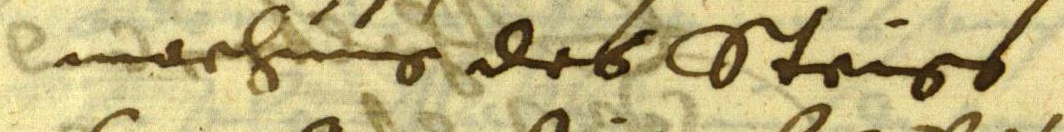machūng des Steigs
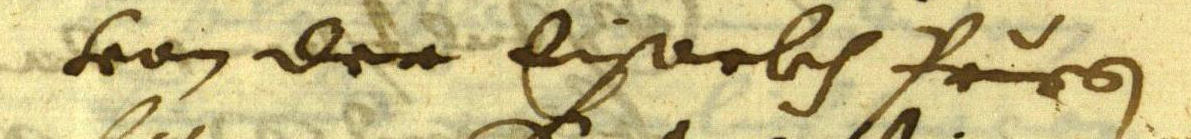von der Eisackh Prūgg
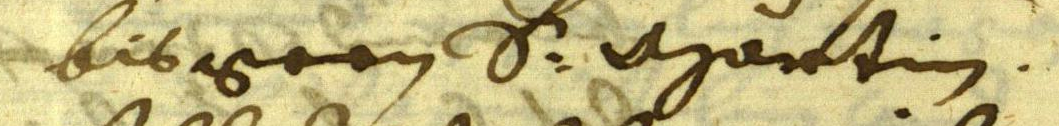bis geen S: Martin.
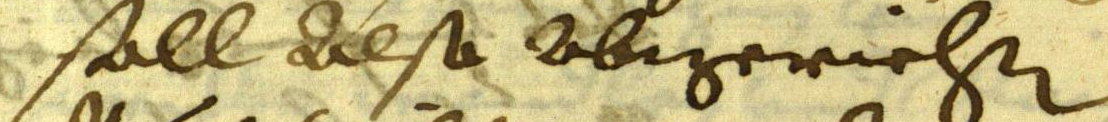soll Also Abzericht
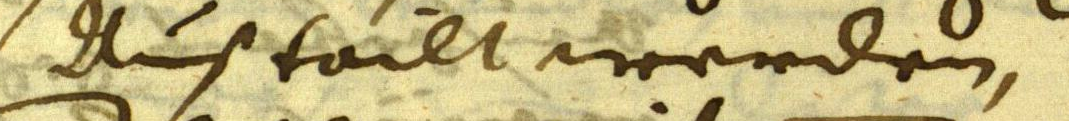Aūs tailt werden,
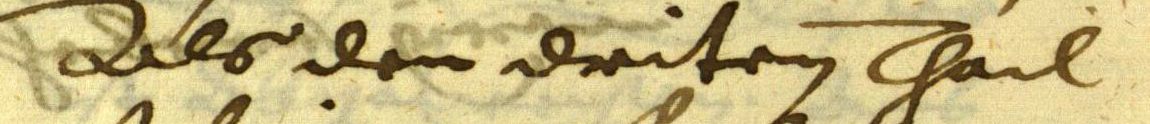Als den driten Thail
